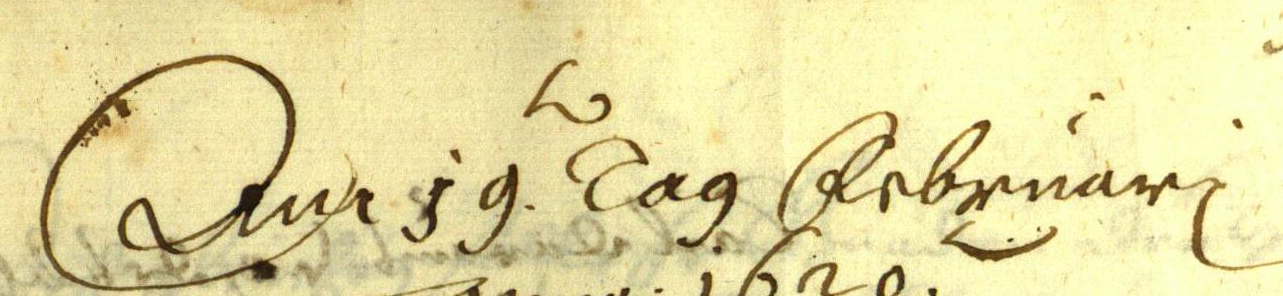Am 19.t Tag Febrūarj
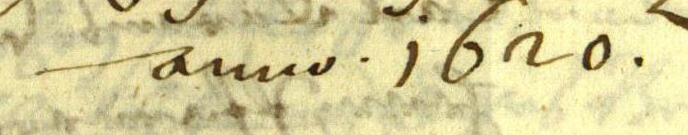Anno. 1620.t
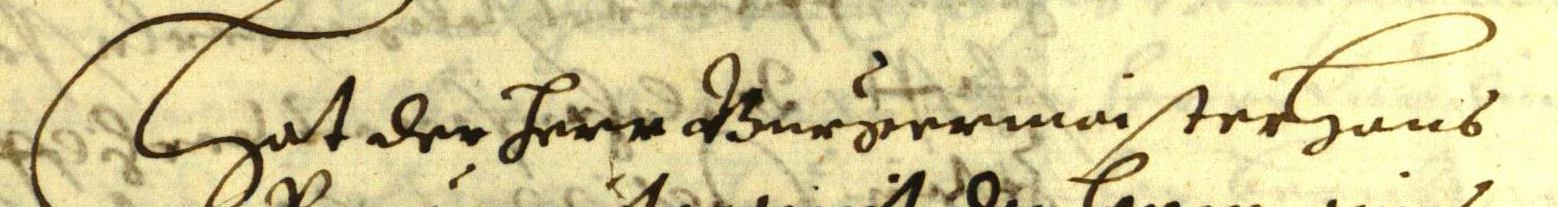Hat der herr Būrgermaister Hans
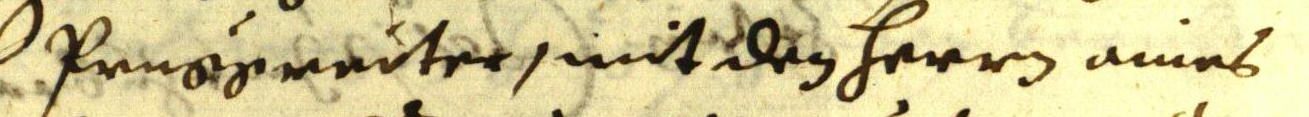Prūggreiter, mit den herrn aines
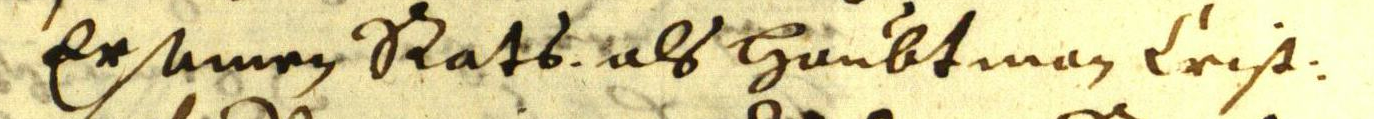Ersamen Rats. als Haūbtman Crist¬
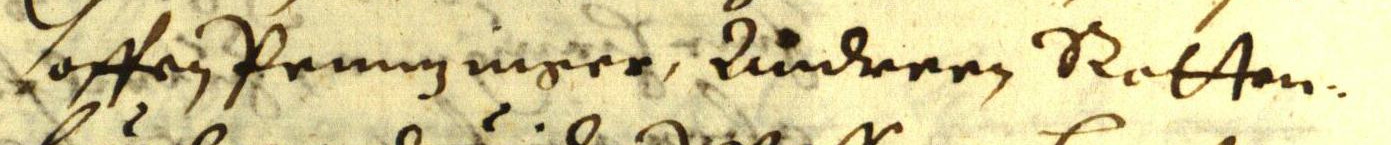offen Pennzinger, Andreen Rotten¬
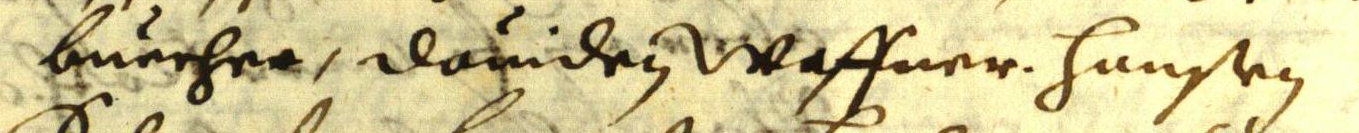būecher, daūiden Waffner. hansen
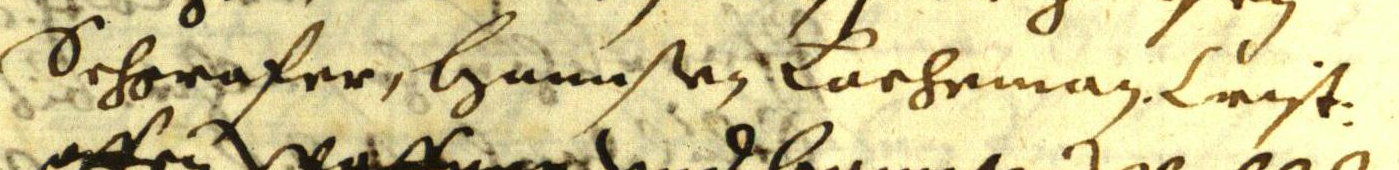Schgrafer, Hannsen Lacheman. Crist¬
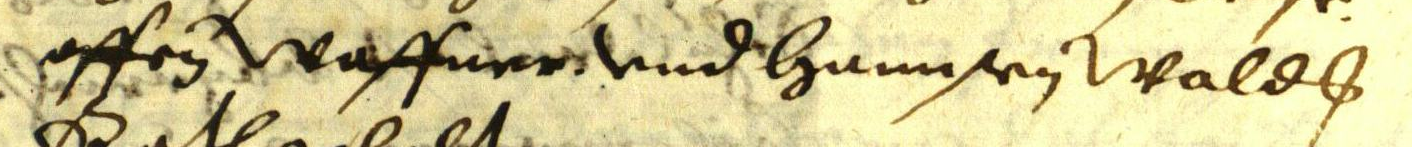offen Waffner. vnd Hannsen Wald
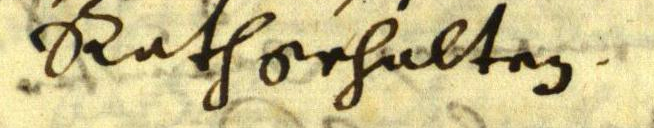Rath gehalten.
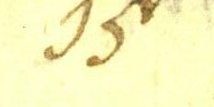15
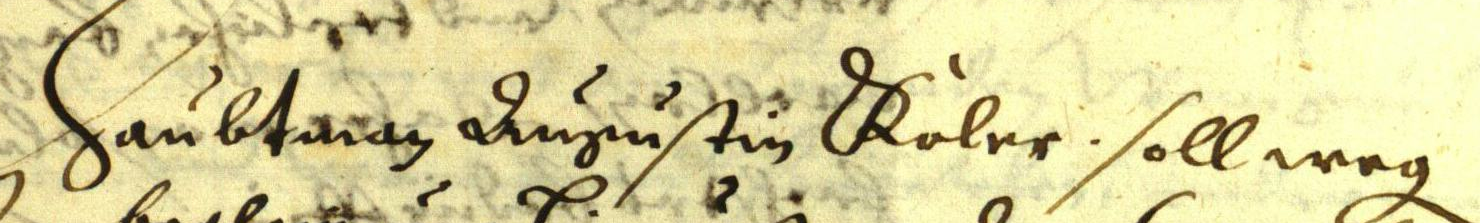Haūbtman Aūgūstin Kōler. soll weg
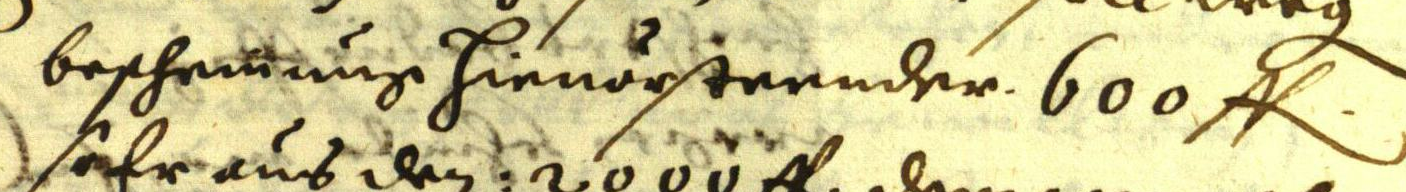beschemūng hievōrsteender. 600 fl.
